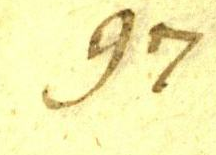97
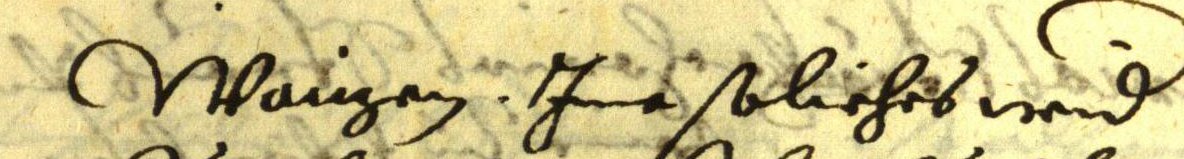Waitzen. Ime soliches wid
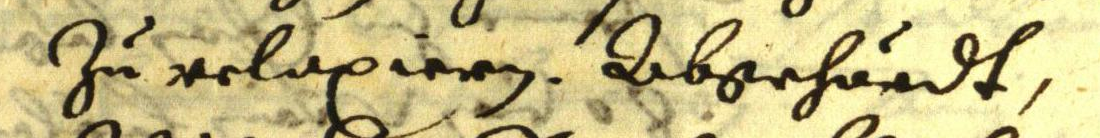Zū relaxiern. Abgehōrdt,
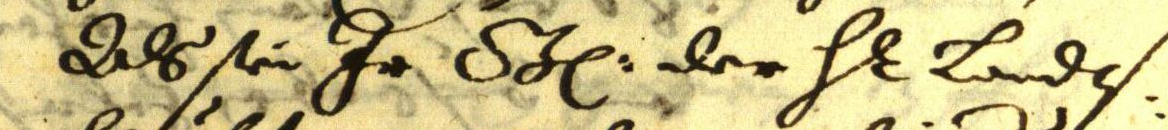Als sei Ir G: der hl Landts¬
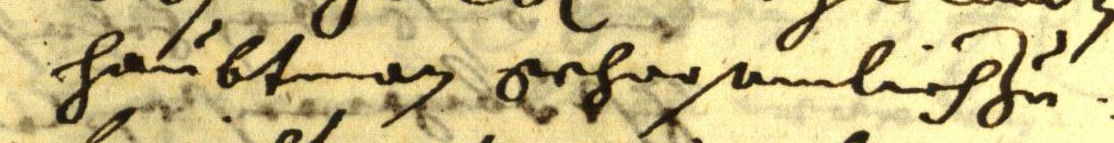haūbtman gehorsamlich Zū¬
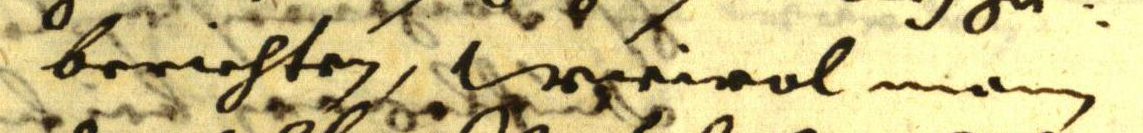berichten, wiewol man
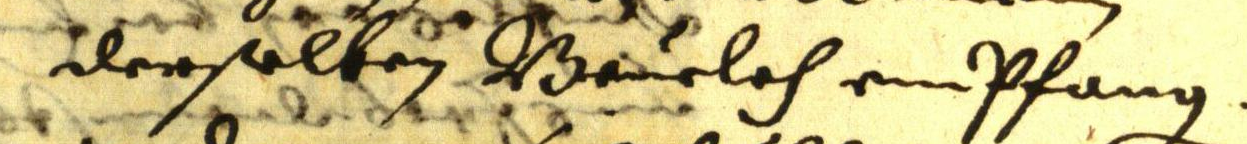derselben Beūelch emPfang.
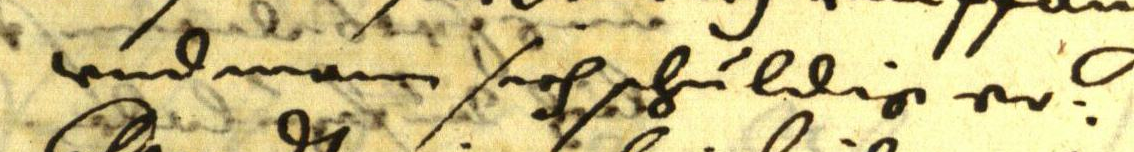vnd man sich schūldig er¬
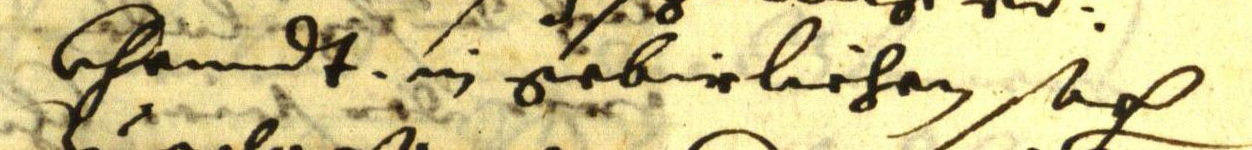khenndt. in gebirlichen sach
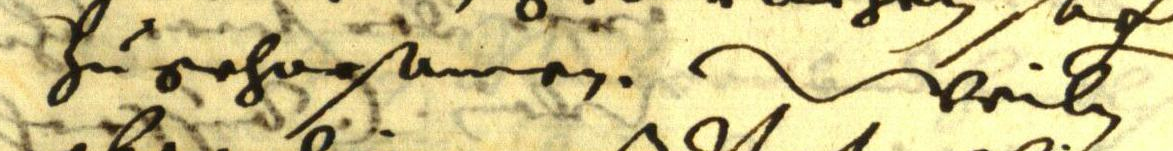Zū gehorsamen. Weiln
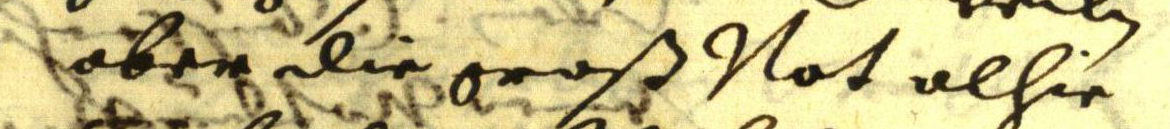aber die groß Not alhie
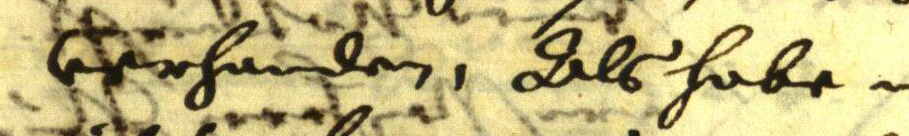verhanden, Als habe mann
